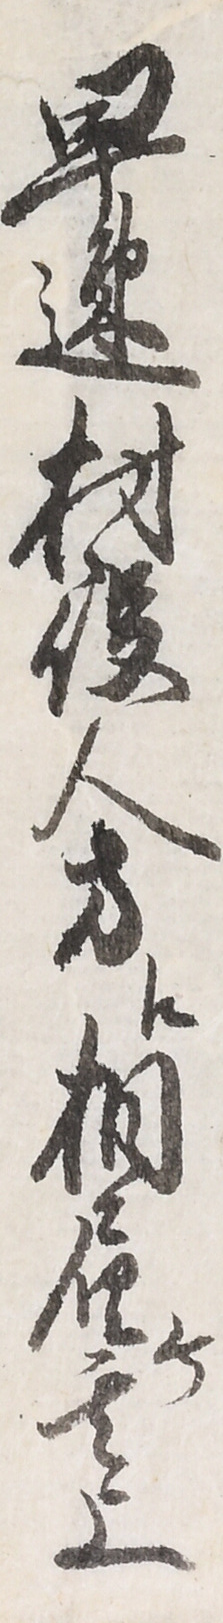早速村役人方え相届其上
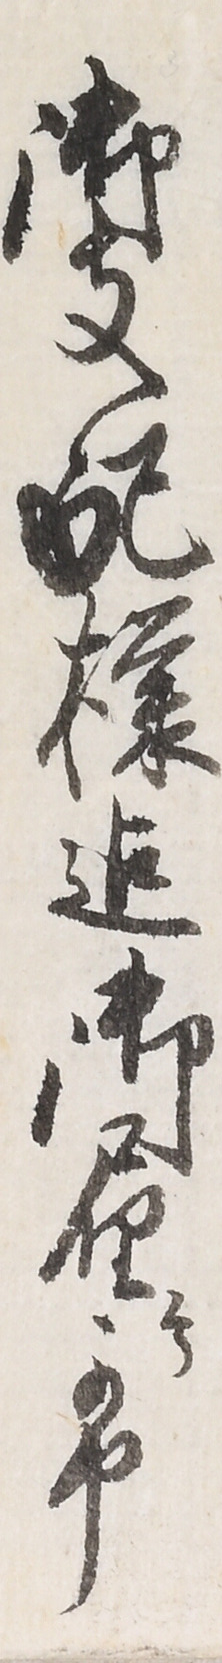支配様迄御届可申
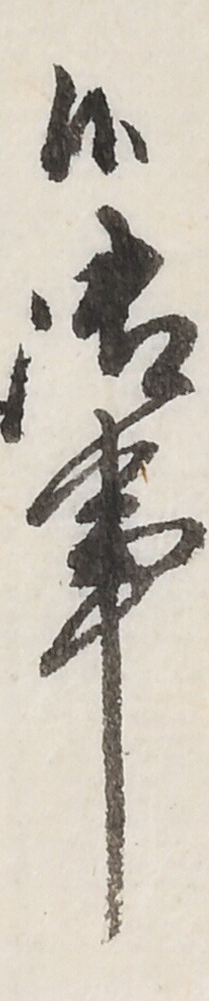候御事
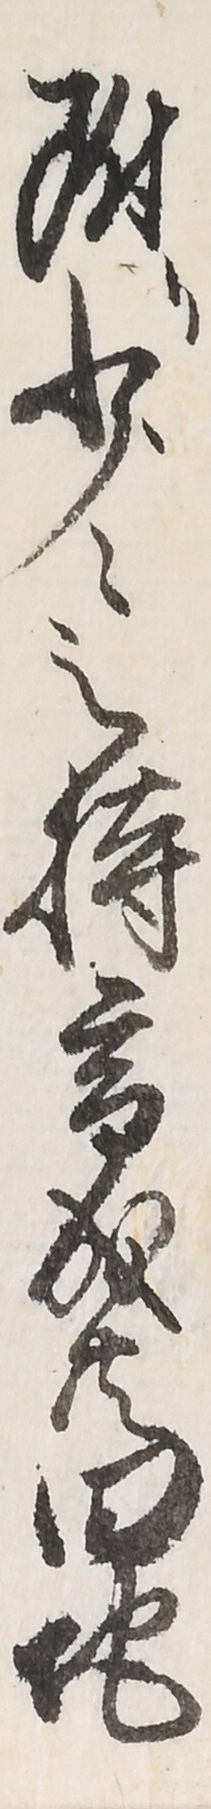附り少々之持高成共田地
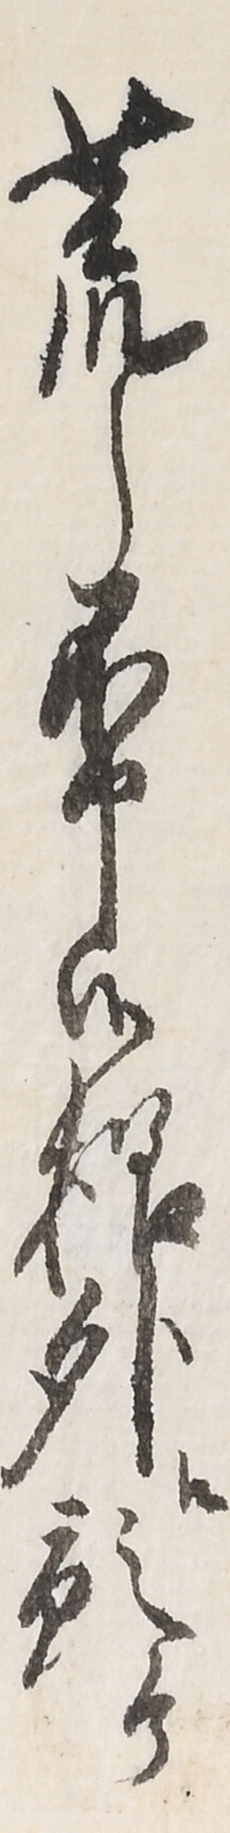荒し不申候様外ニ預
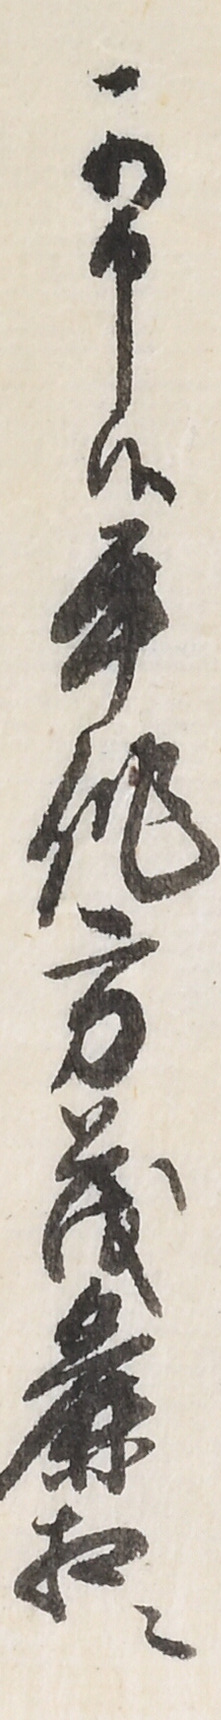可申候手作方も麤相ニ
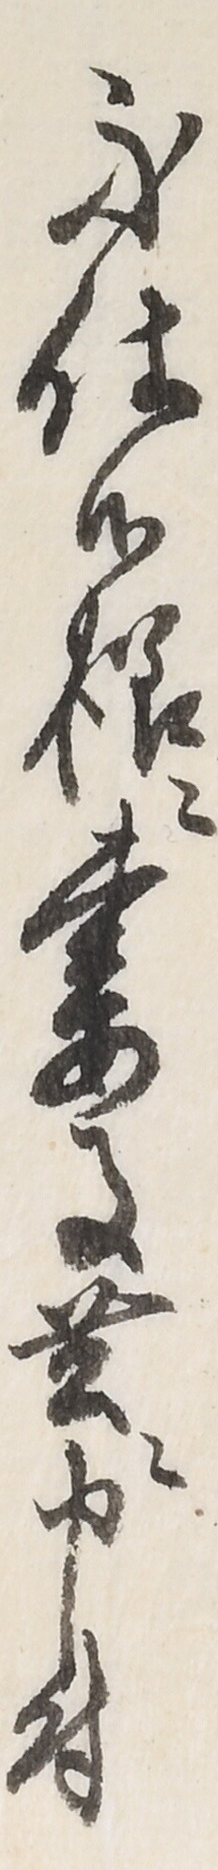不仕候様ニ妻子共ニ申付
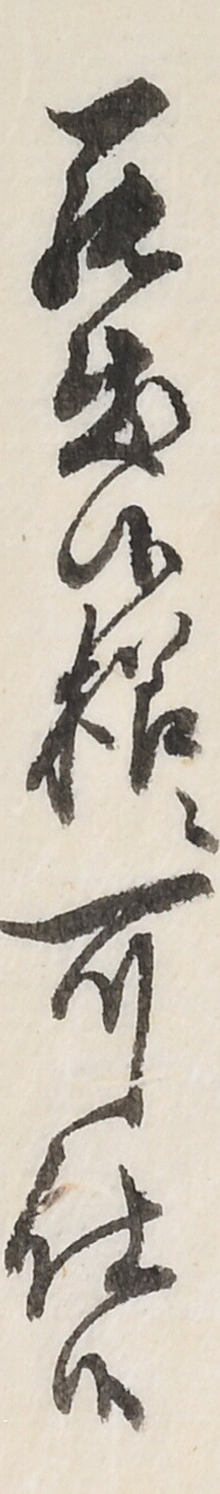罷出候様ニ可仕候
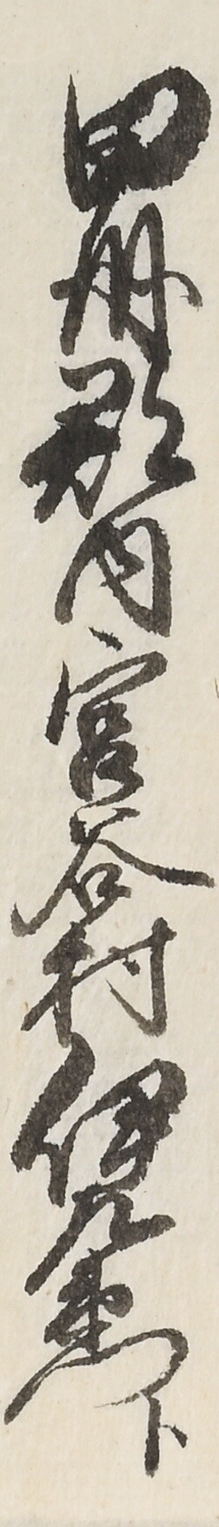甲州郡内宮谷村伊左衛門
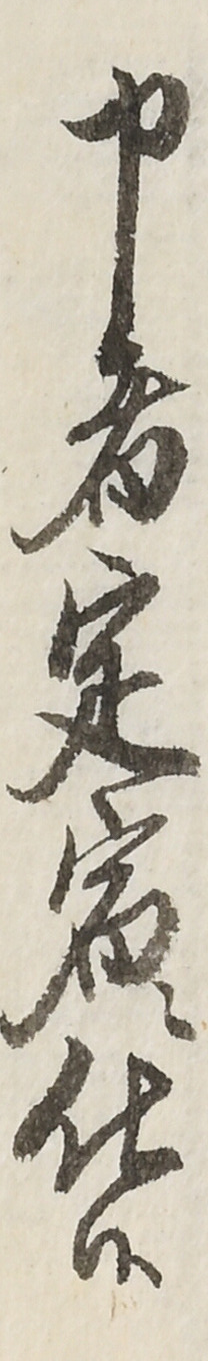申者定宿ニ仕候

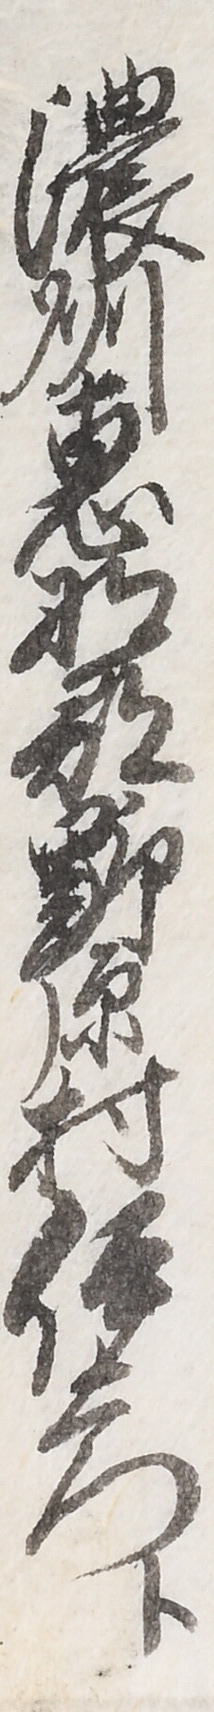濃州恵那郡野原村伊右衛門
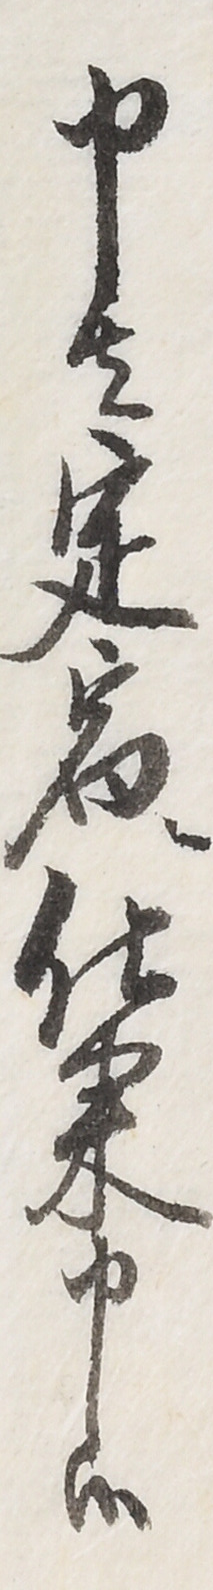申者定宿ニ仕参申候
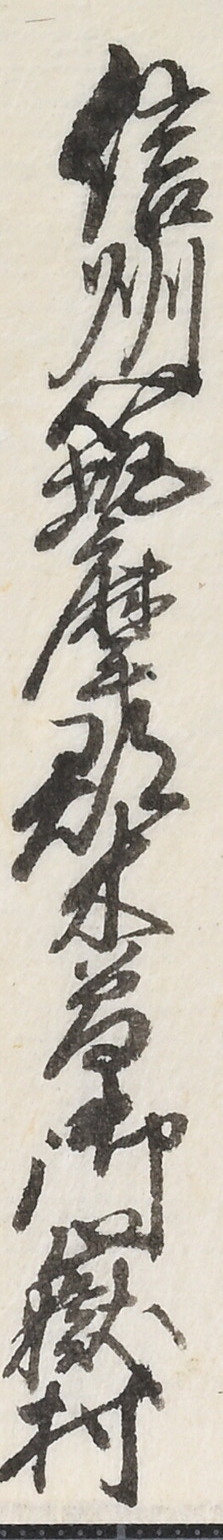信州筑摩郡木曾御岳村
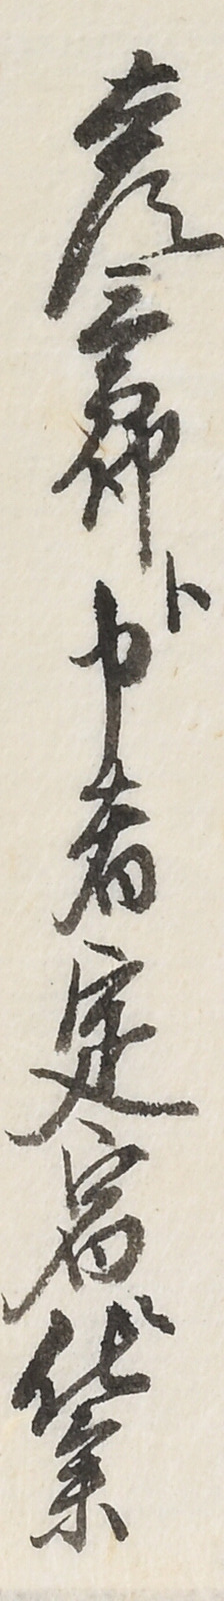彦三郎申者定宿ニ仕参
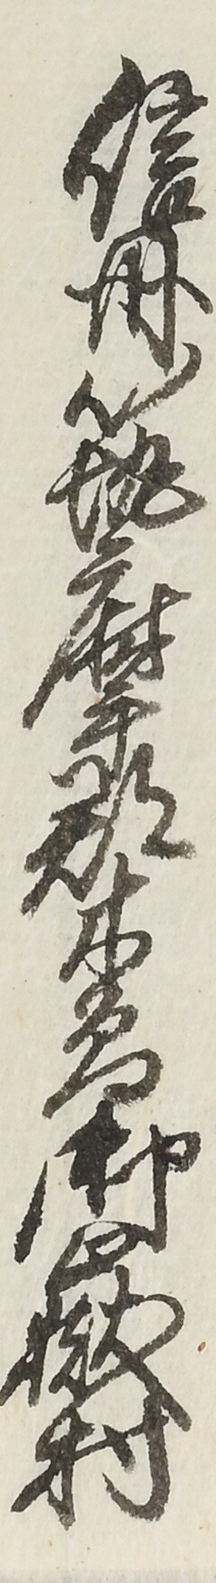信州筑摩郡木曾御岳村
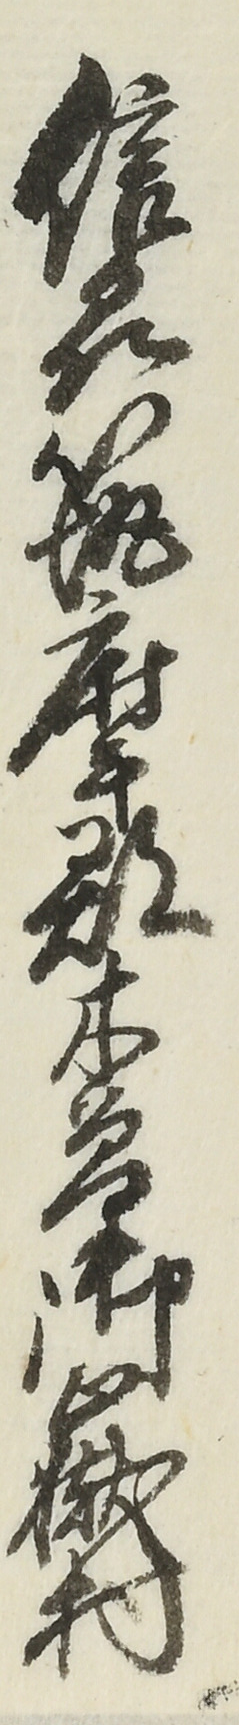信州筑摩郡木曾御岳村
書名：万延二辛酉年二月日他國石切稼書上帳
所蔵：伊那市立高遠町図書館・合同会社AMANE
